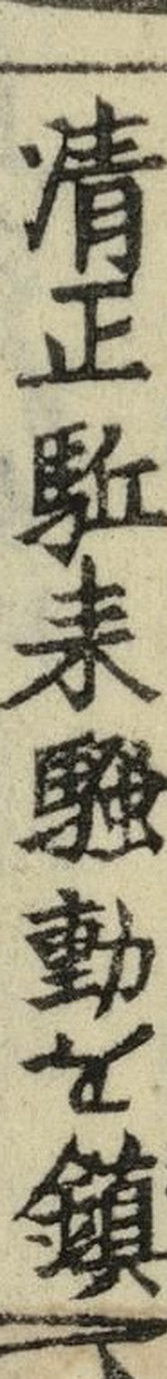清正駈来騒動を鎮

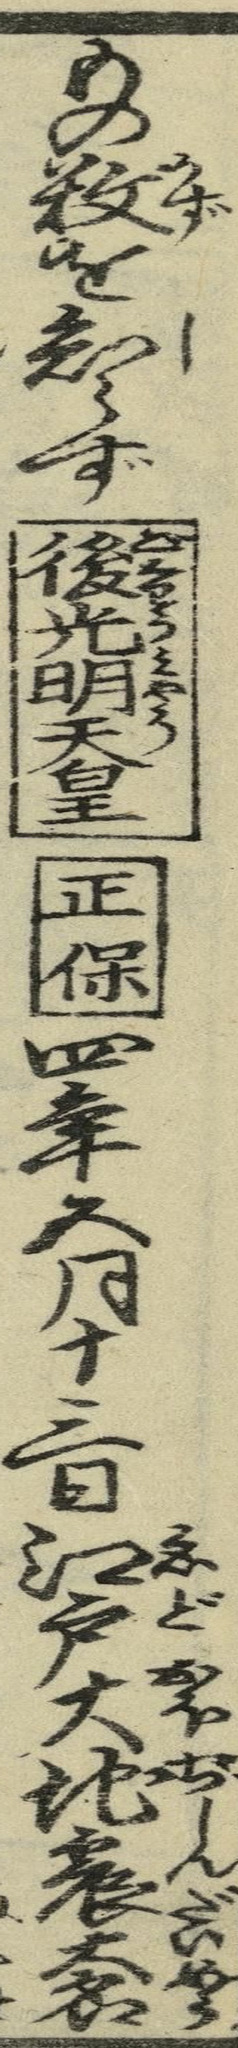もの数を知らず後光明天皇正保四年五月十三日江戸大地震大名
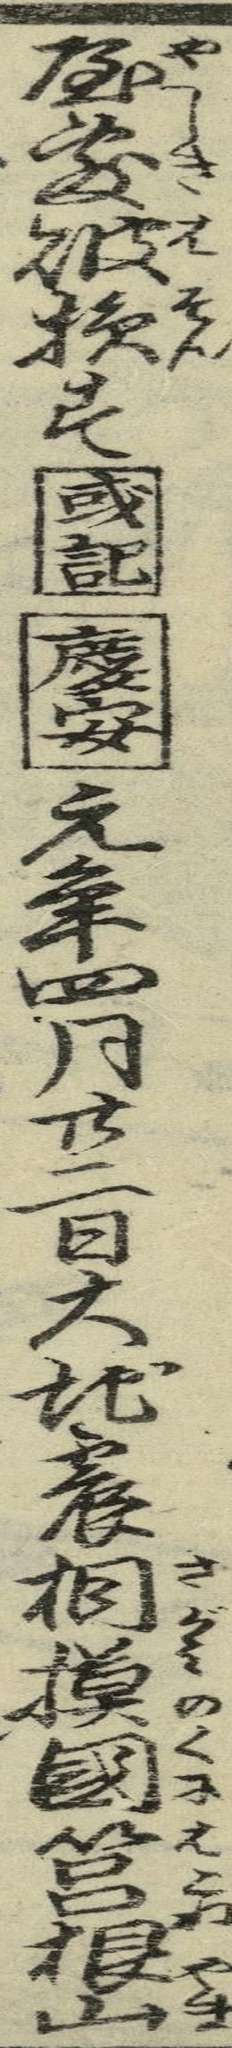屋敷破損す或記慶安元年四月廿二日大地震相模国筥根山
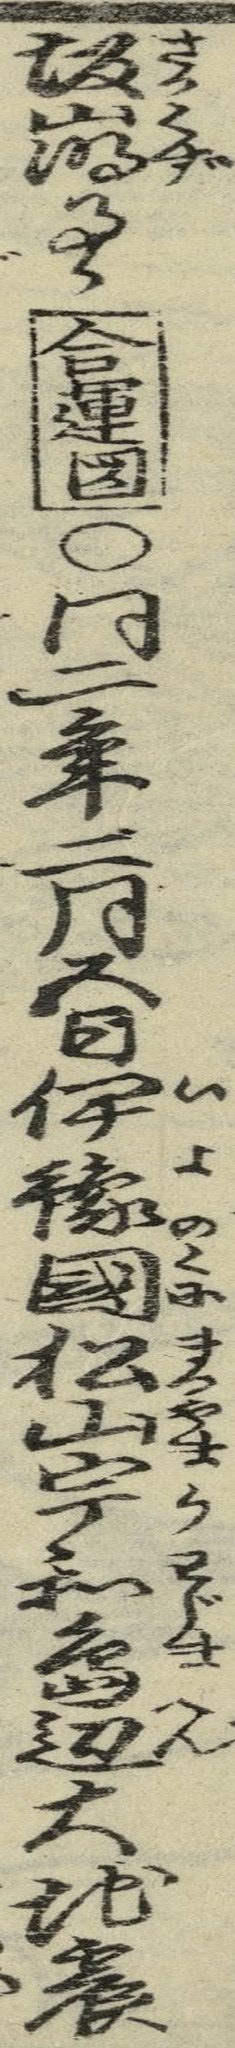坂崩るゝ合運図○同二年二月五日伊予国松山宇和島辺大地震
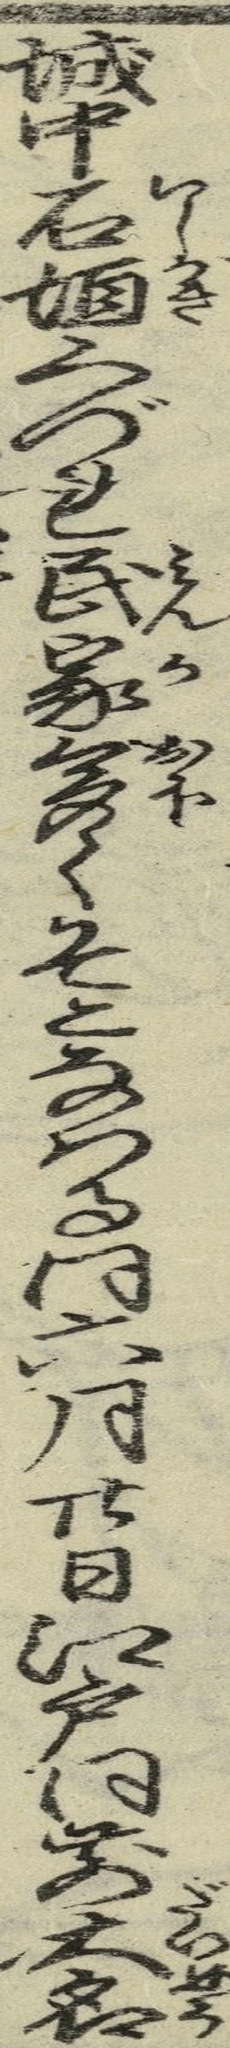城中石垣くづれ民家多くそこなはる同六月廿日江戸同前大名
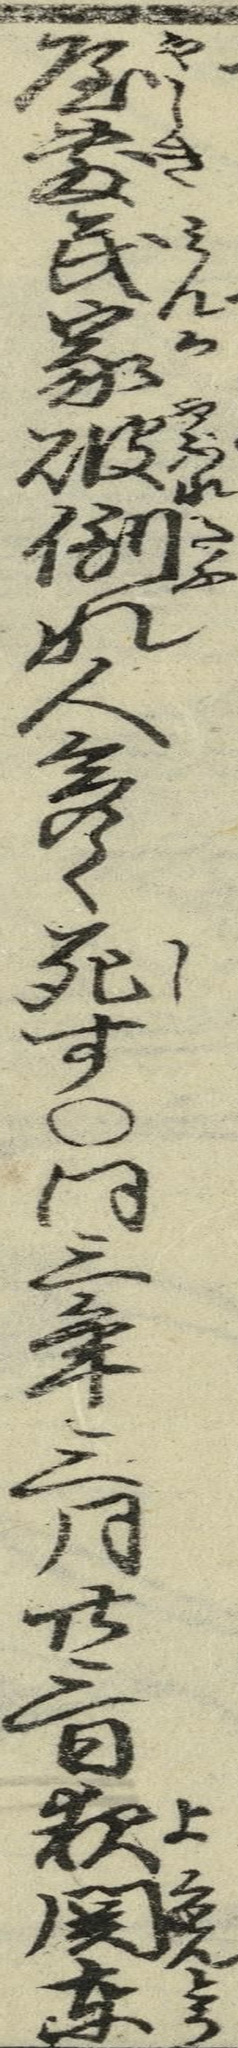屋敷民家破倒れ人多く死す○同三年三月廿三日夜関東
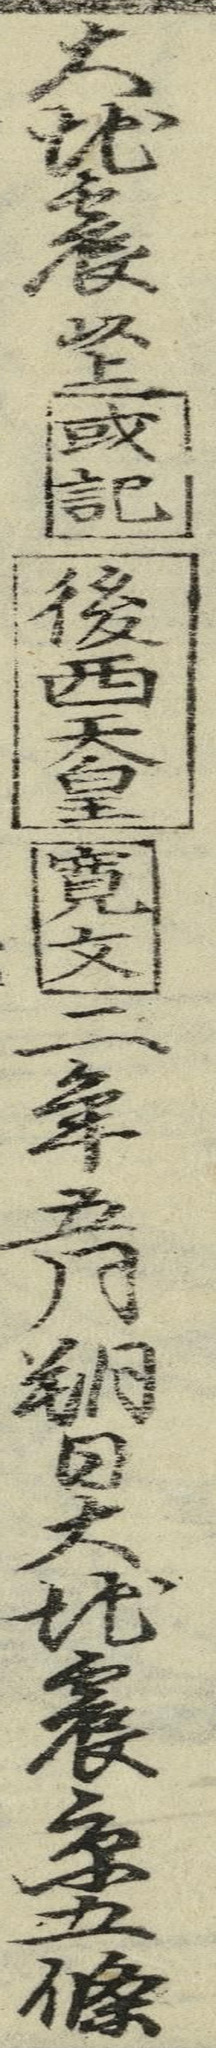大地震以上或記後西天皇寛文二年五月朔日大地震京五條
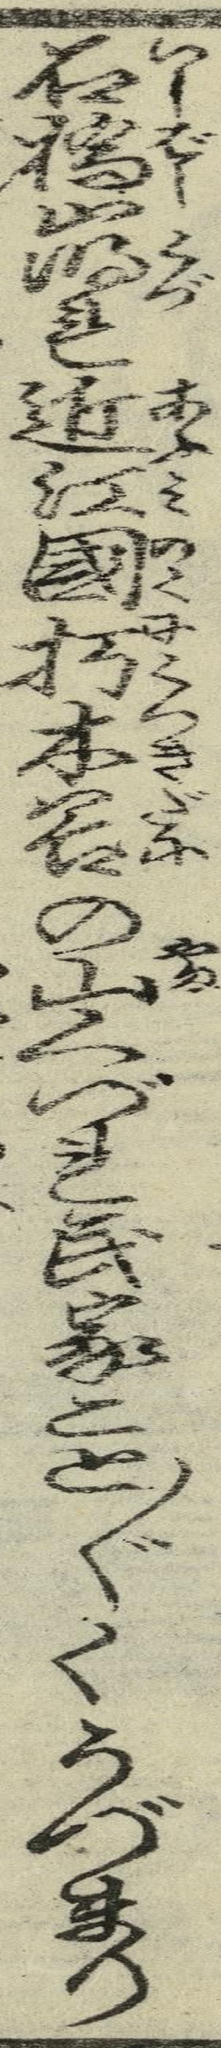石橋崩れ近江国朽木谷の山くづれ民家こと〴〵くうづまり
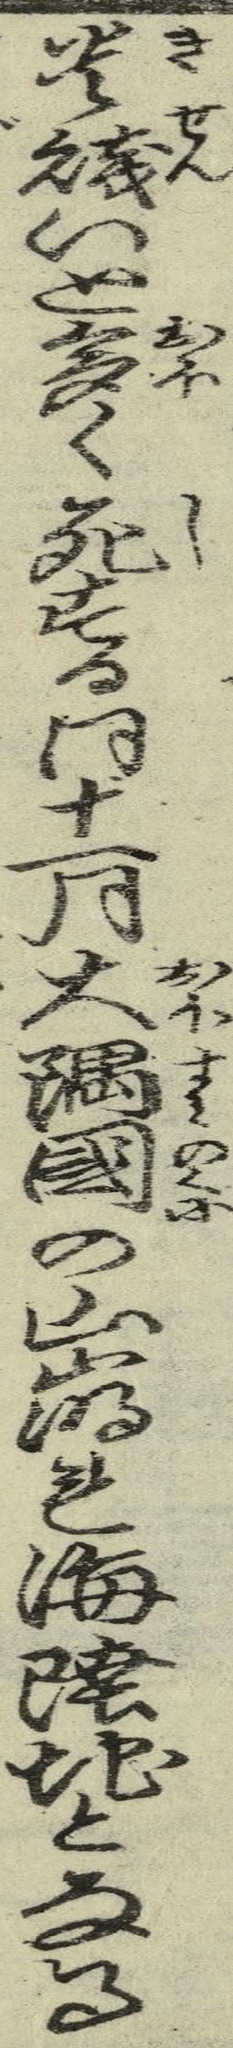貴賤いと多く死する同十一月大隅国の山崩れ海陸地となる
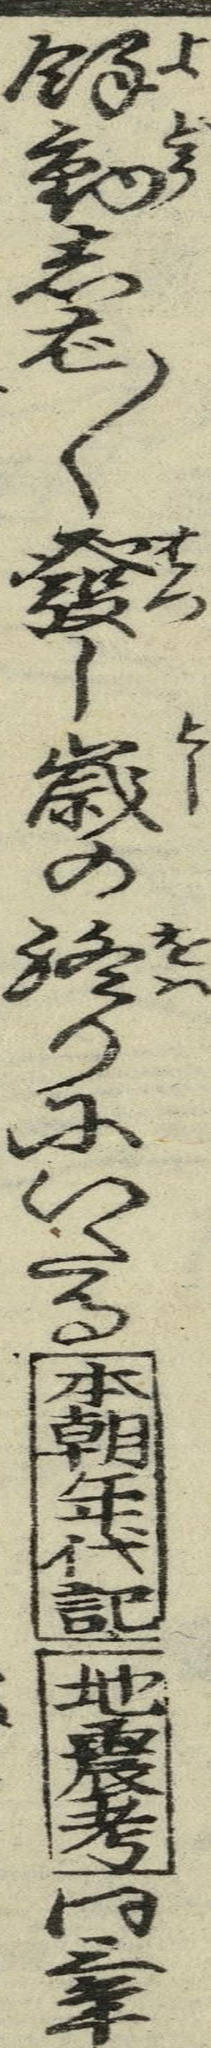余動しば〳〵発し歳の終りにいたる本朝年代記地震考同三年
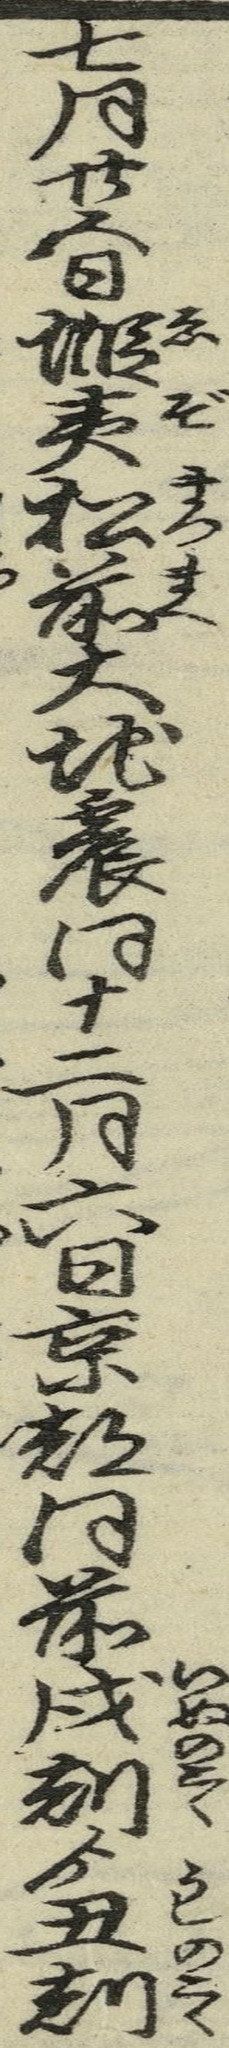七月廿五日蝦夷松前大地震同十二月六日京都同前戌刻ゟ丑刻
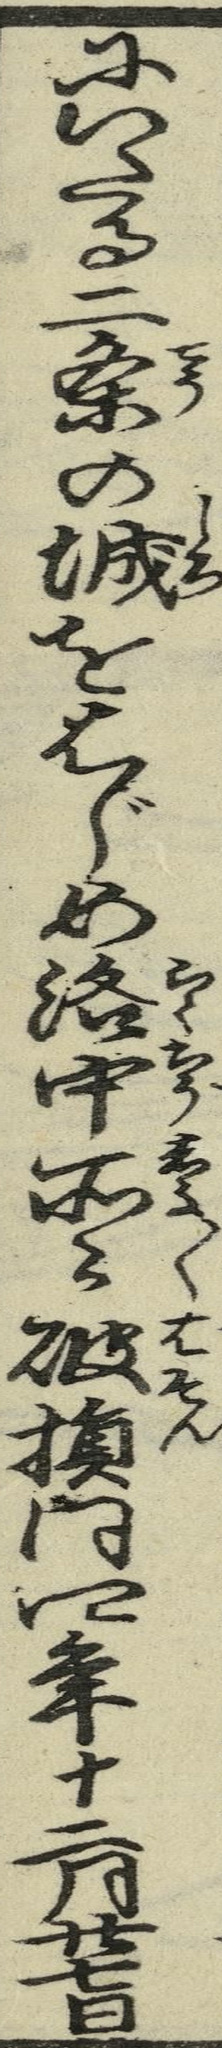にいたる二条の城をはじめ洛中所々破損同四年十二月二十七日
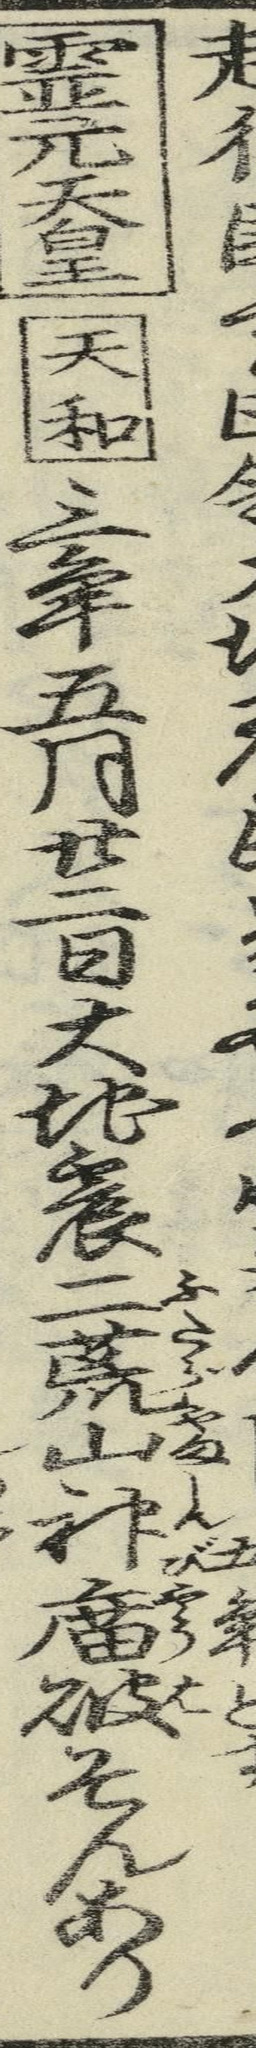霊元天皇天和三年五月廿二日大地震二荒山神庿破そんあり
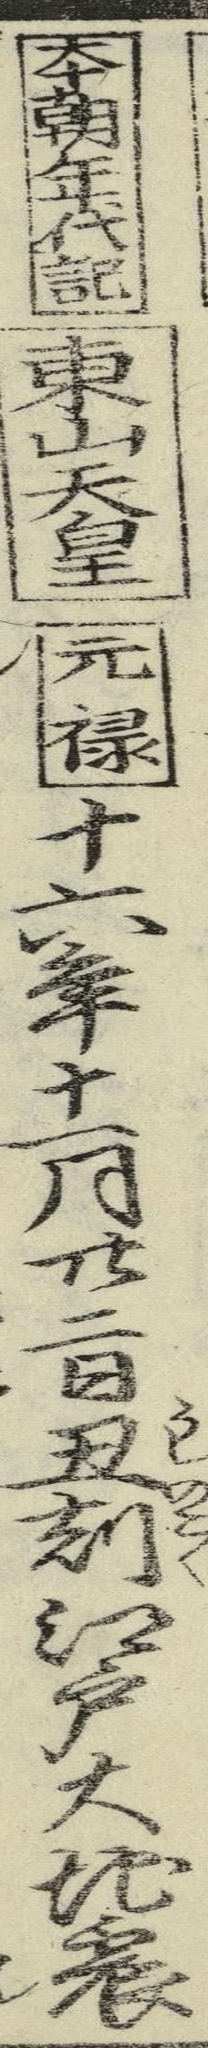本朝年代記東山天皇元禄十六年十一月廿二日丑刻江戸大地震
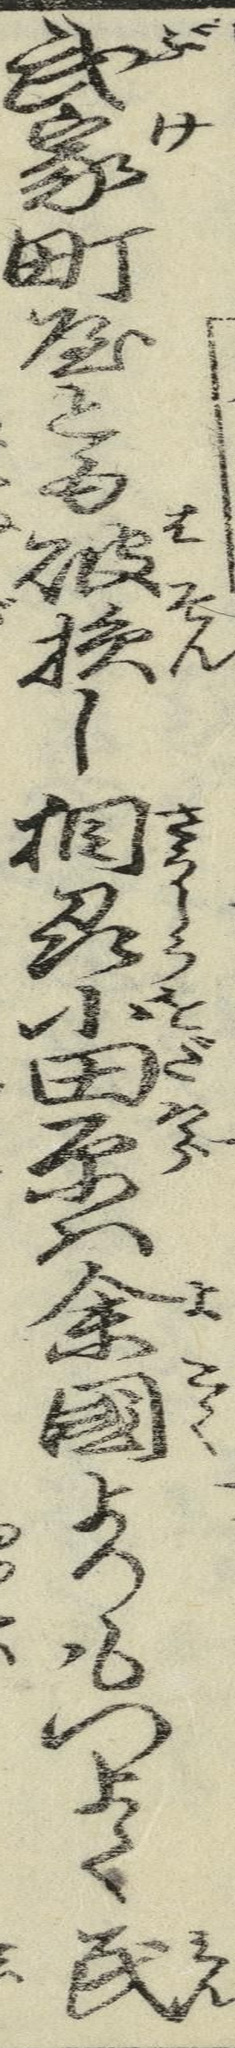武家町屋とも破損し相州小田原は余国よりもつよく民
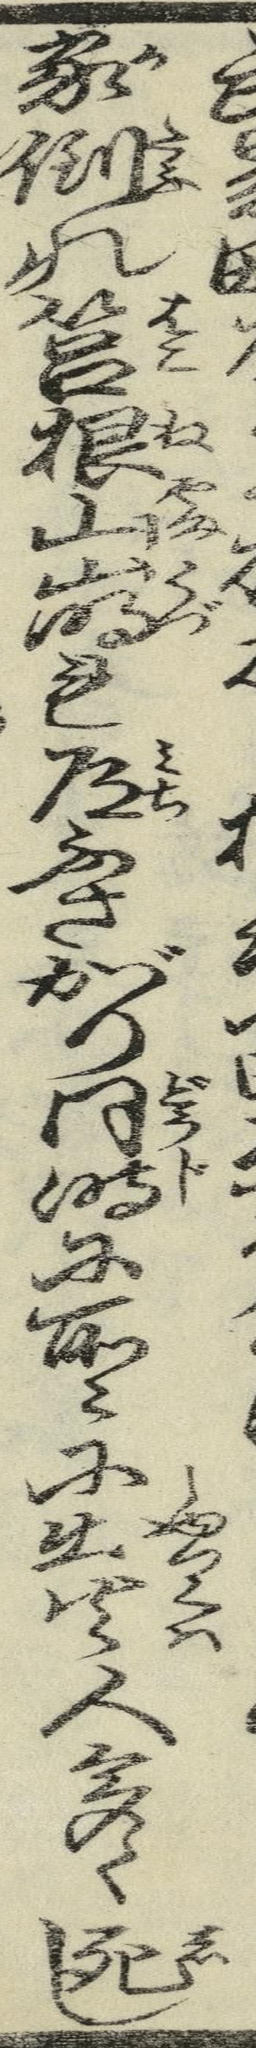家倒れ筥根山崩れ道ふさがり同時に所々に出火人多く死し
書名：地震年代記
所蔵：東京大学地震研究所図書室 Earthquake Research Institute Library, The University of Tokyo, JAPAN
